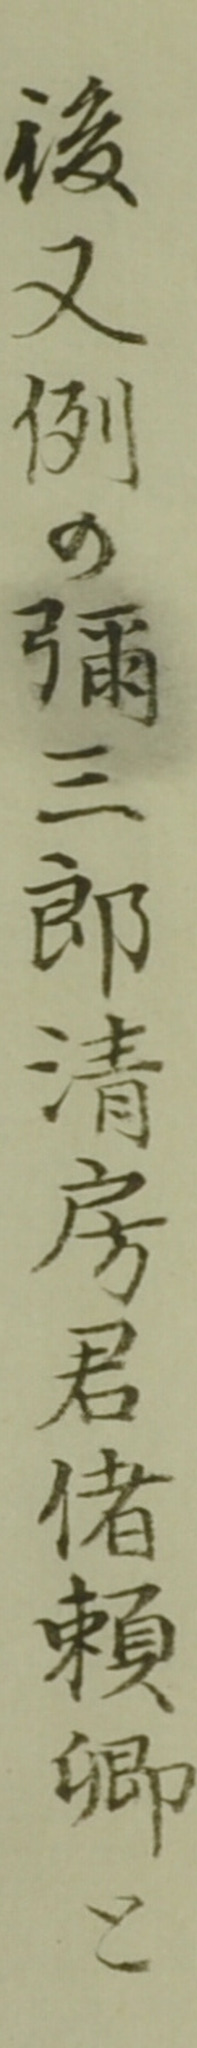後又例の弥三郎清房君偖頼卿と
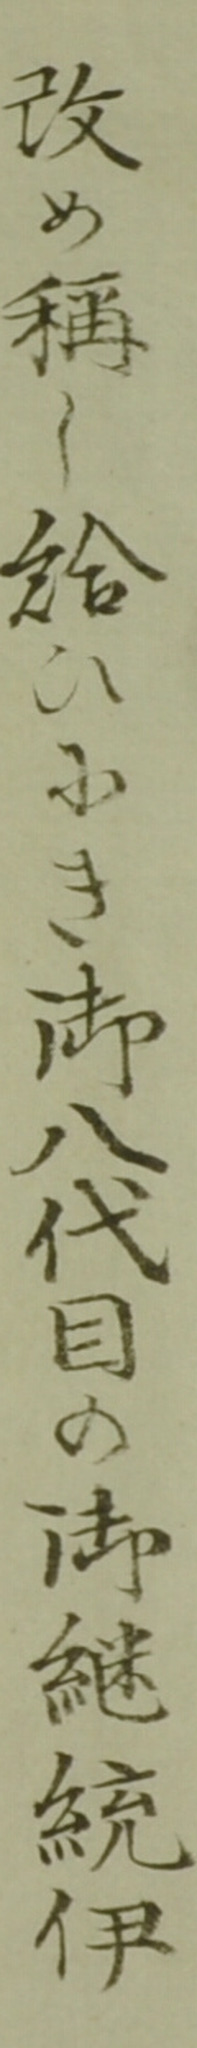改め称し給ひにき御八代目の御継統伊
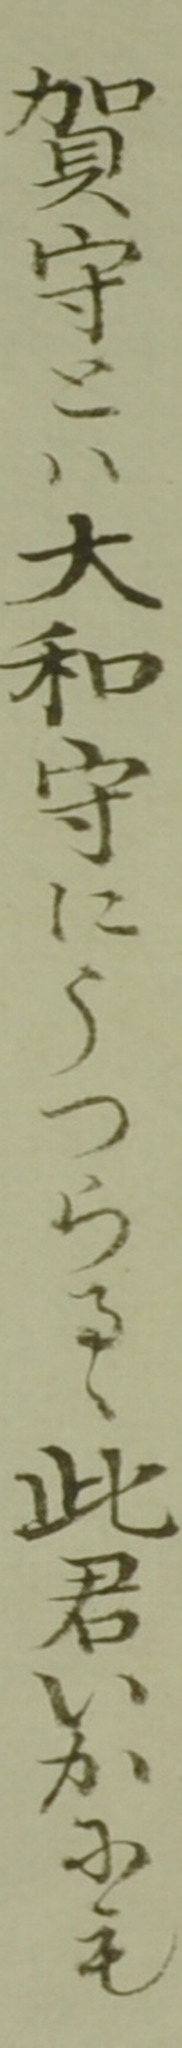賀守とハ大和守にうつらるゝ此君いかにも
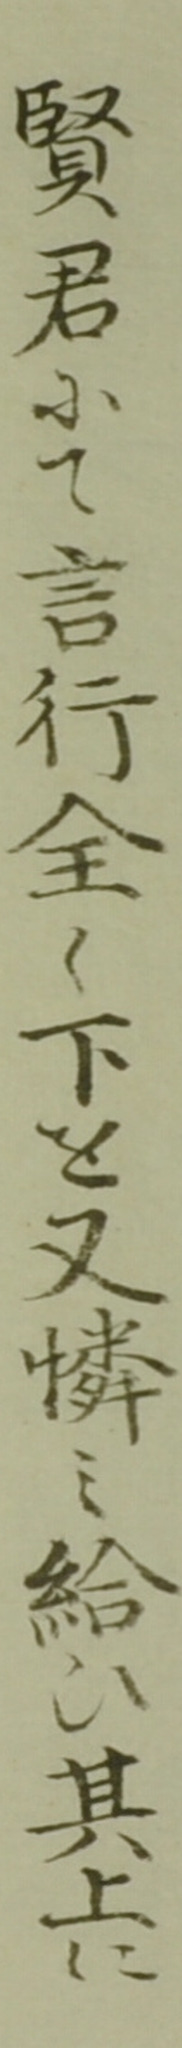賢君にて言行全く下を又憐ミ給ひ其上に
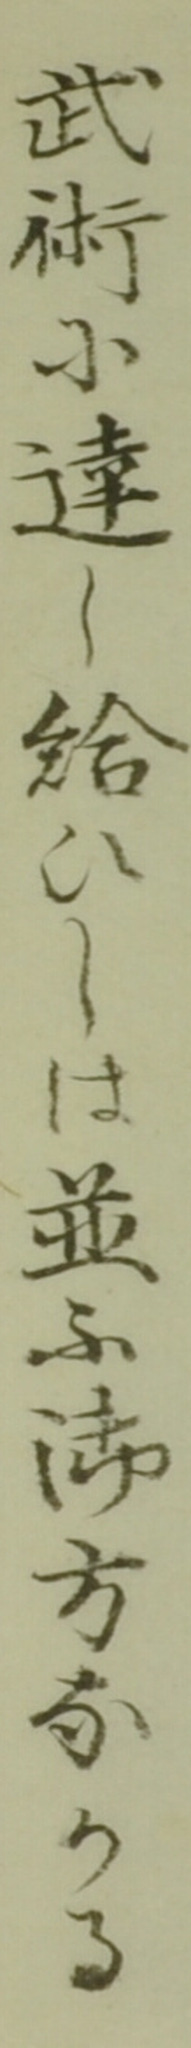武術に達し給ひしは並ふ御方なかる
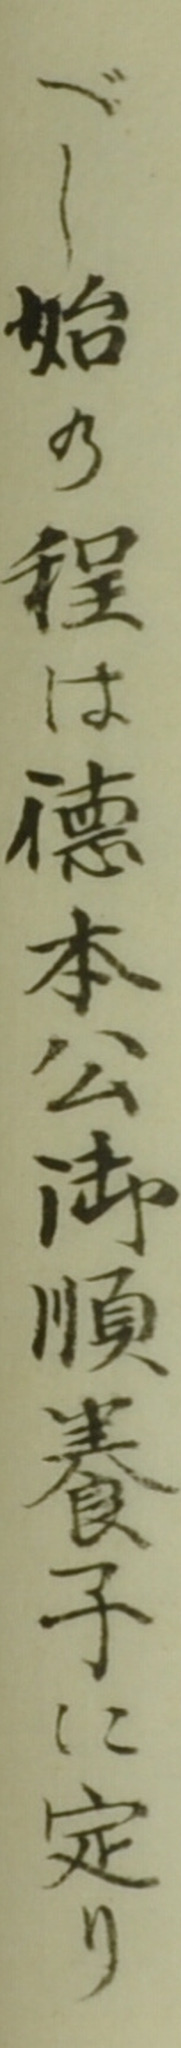べし始の程は徳本公御順養子に定り
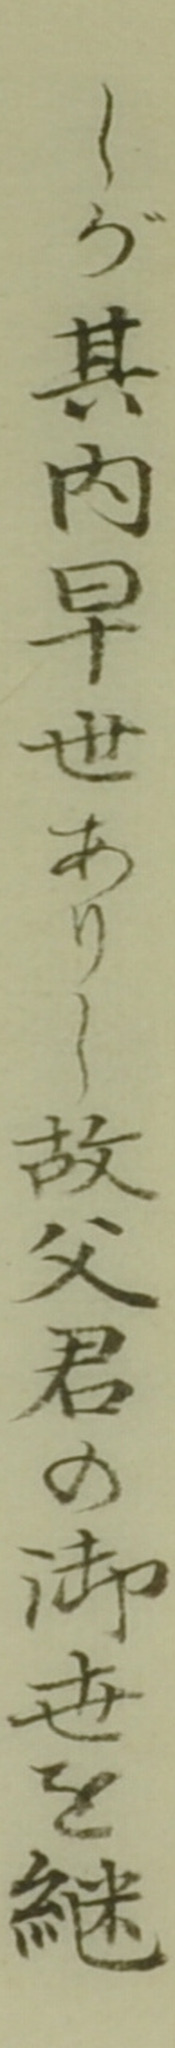しが其内早世ありし故父君の御世を継
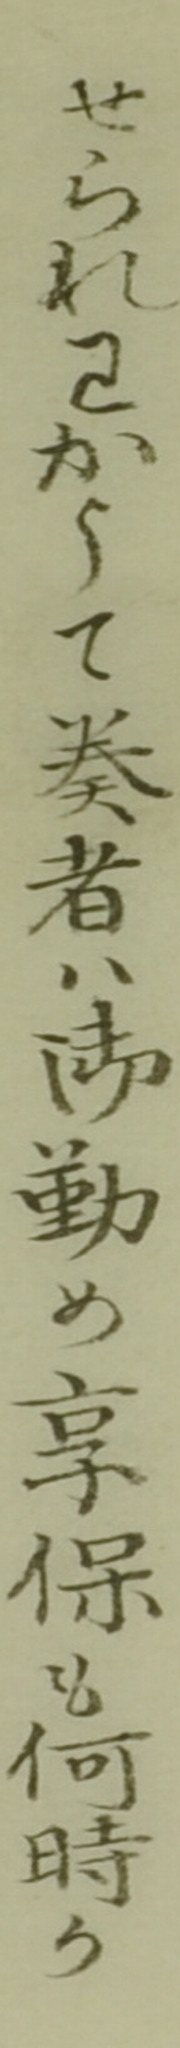せられわかうて奏者ハ御勤め享保も何時か
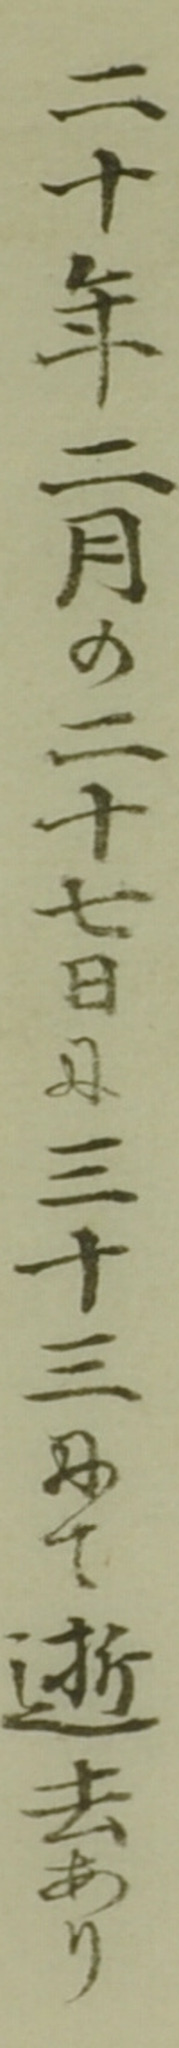二十年二月の二十七日に三十三にて逝去あり
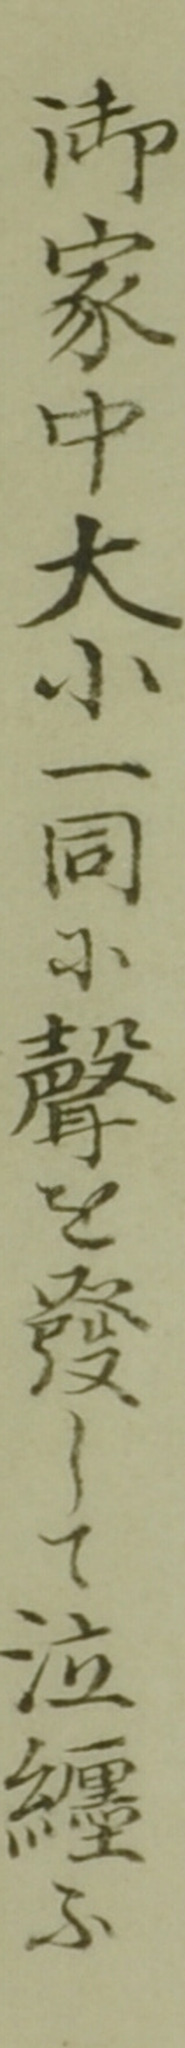御家中大小一同声を発して泣纏ふ
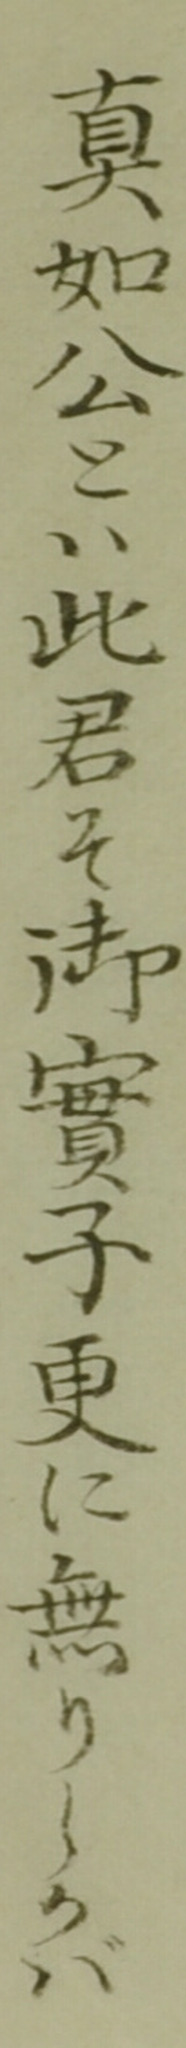真如公とハ此君そ御実子更に無りしかバ
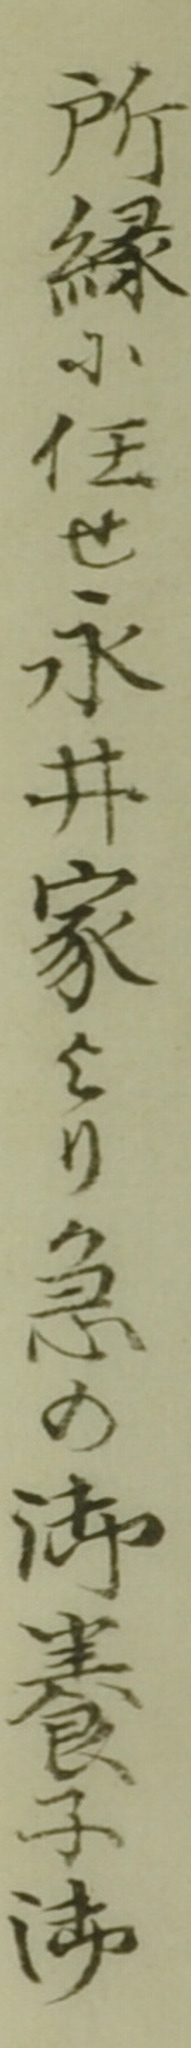所縁に任せ永井家より急の御養子御

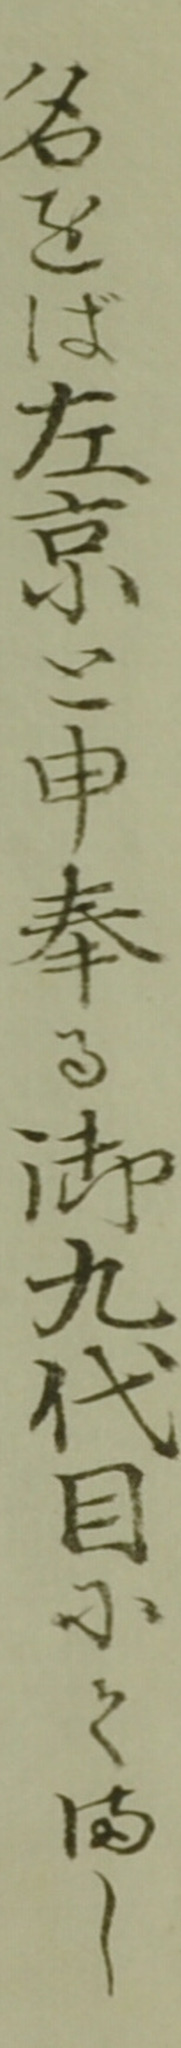名をば左京と申奉る御九代目にてまし
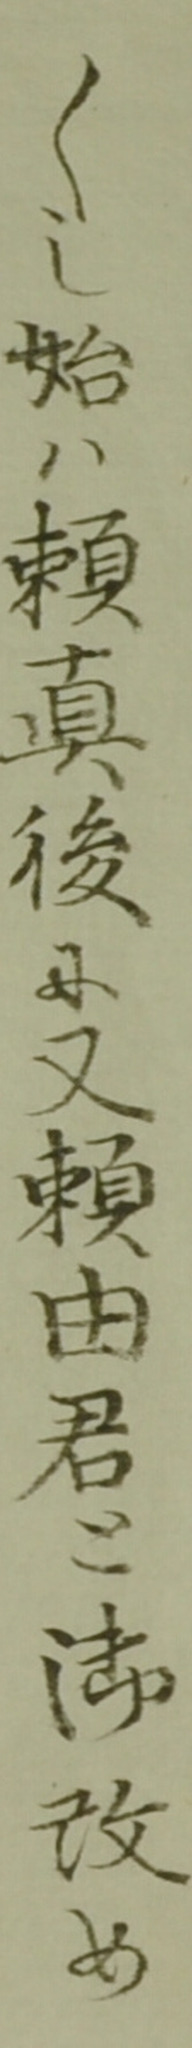〳〵し始ハ頼真後に又頼由君と御改め
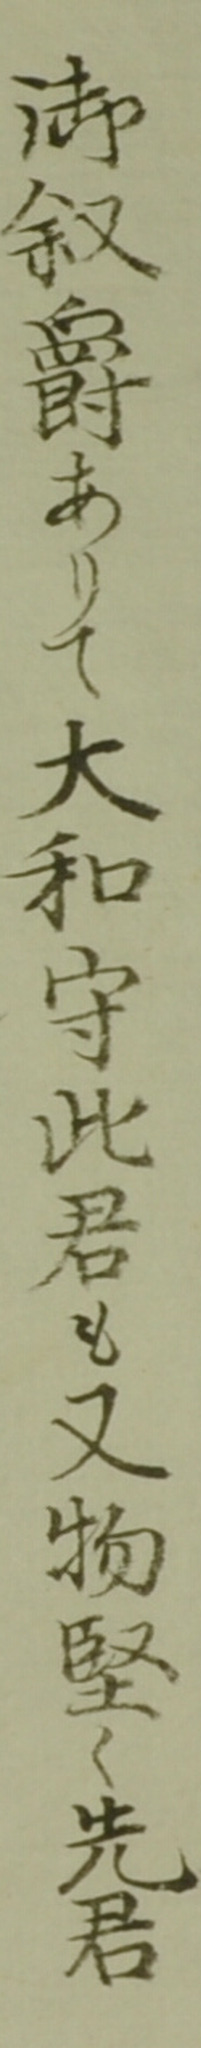御叙爵ありて大和守此君も又物堅く先君
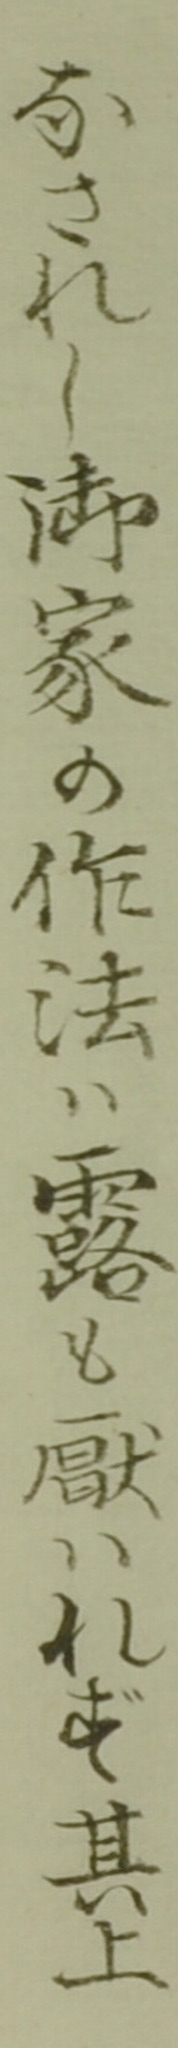なされし御家の作法ハ露も厭ハれず其上
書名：藤葛（全）
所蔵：伊那市立高遠町図書館・合同会社AMANE
